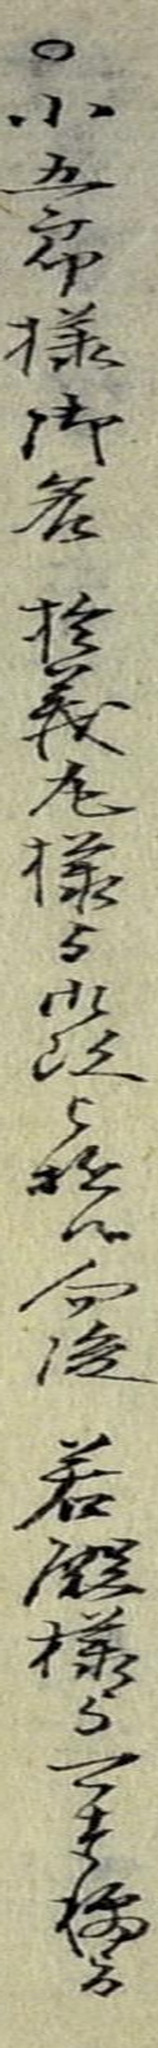〇小五郎様御名於義丸様与御改被遊候向後若殿様与可奉称旨
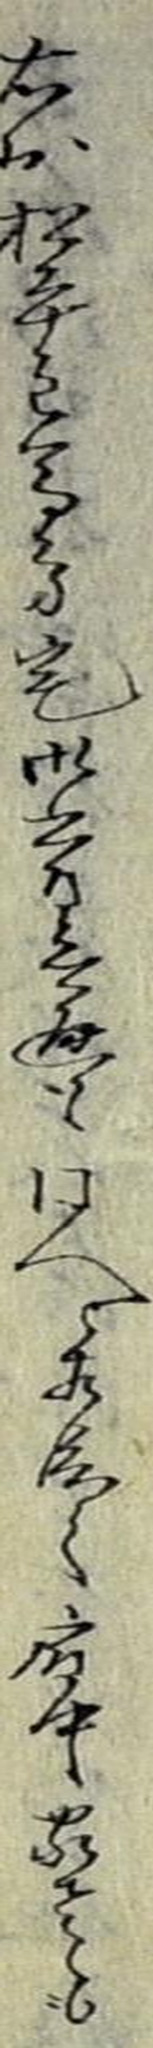右於松平主馬方宅御書付壱通ツヽ同人被相渡之府中家老へも
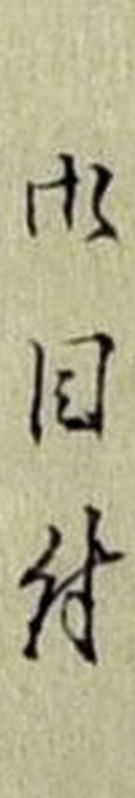御目付
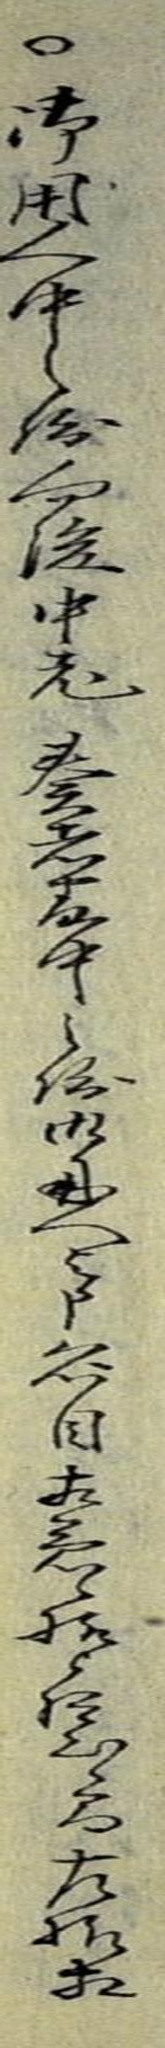〇御用人中之儀向後中老奏者番中之儀御用人与申名目相兼候様被仰出候間左様相
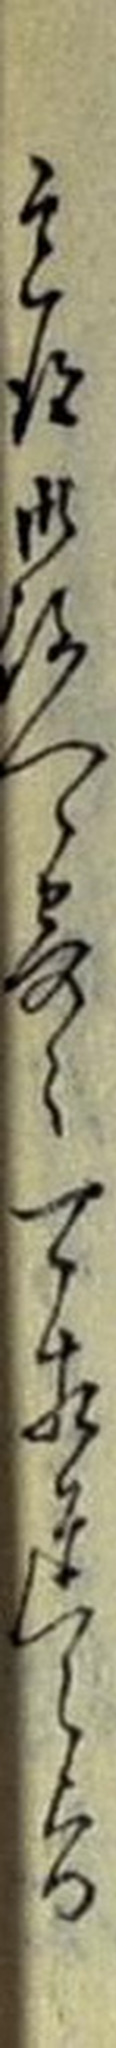意得御役人へ寄々可相達之旨
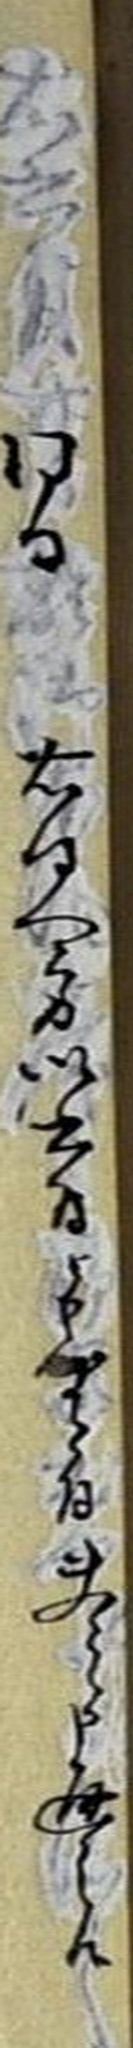同日右同人方以書付被申聞候ニ付夫々へ申通之候
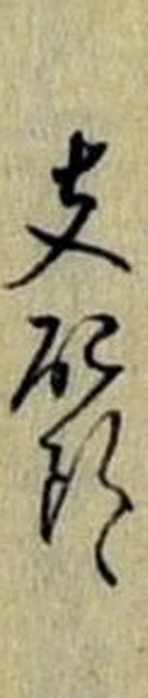支配頭へ
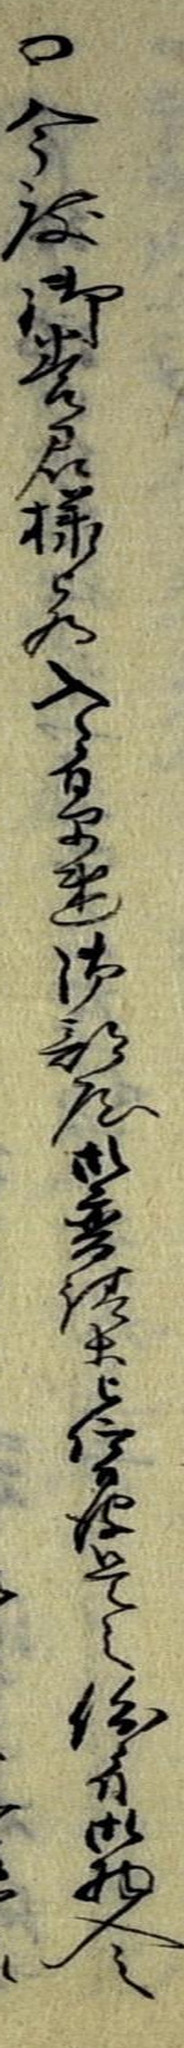〇今度御養君様被為入候ニ付早速御部屋御普請等被仰付儀是之儀ニ付御物入之
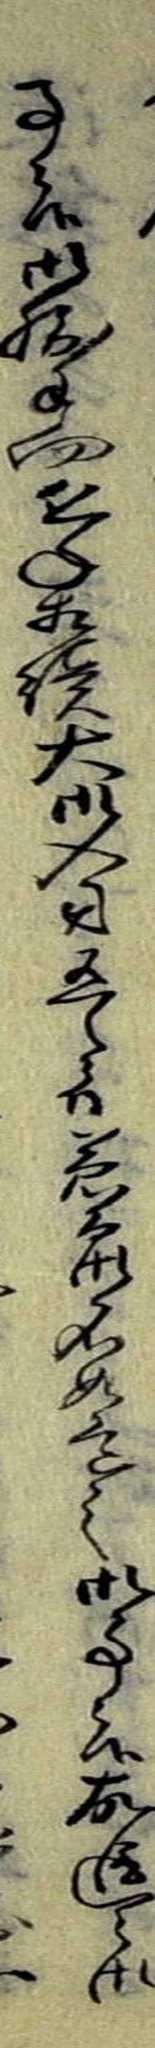事ニ候御勝手向近年相続大御入用有之ニ付兼而御不如意之御事ニ候故追々御
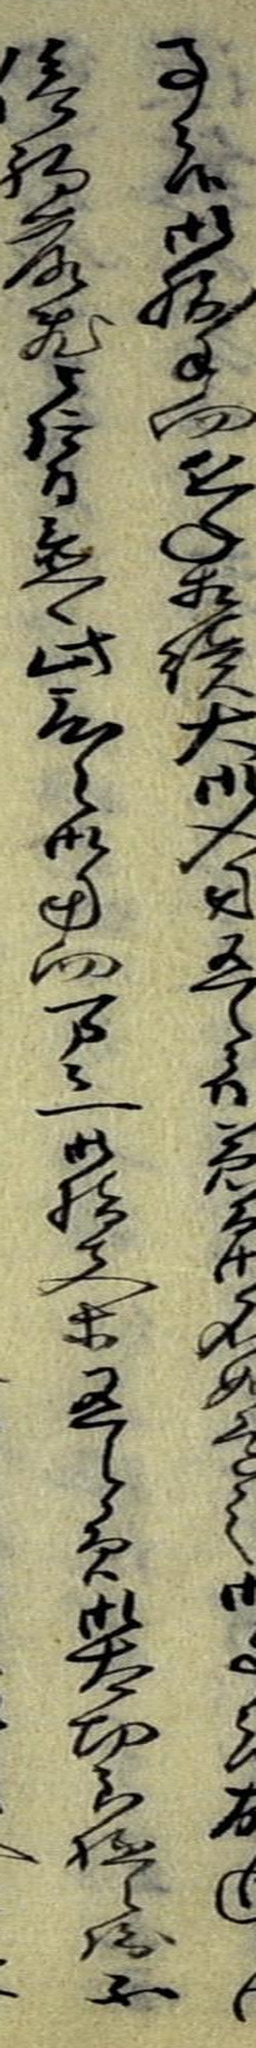倹約厳敷被仰付置候此度之御用向万々一御指支等有之候而ハ御太切至極之儀不
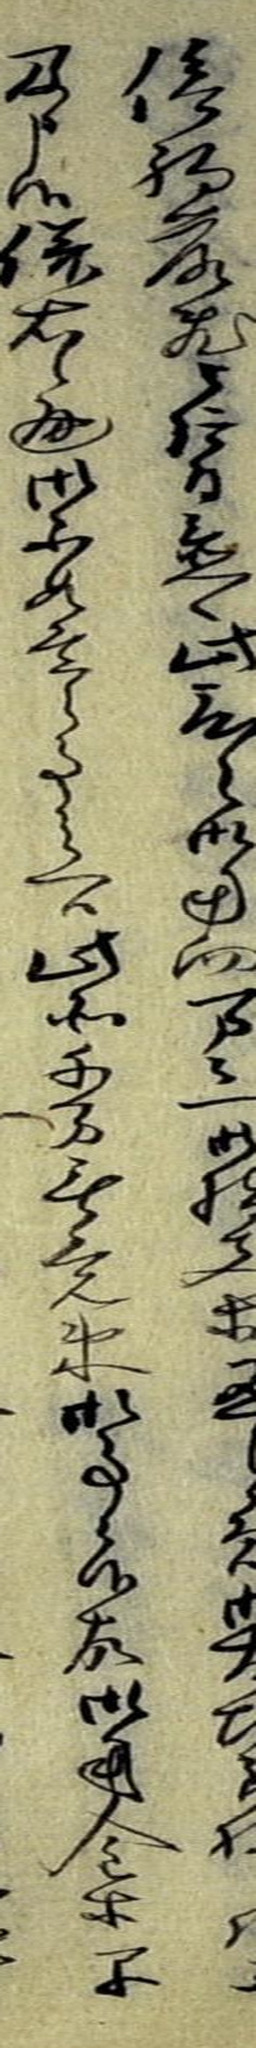及申候併右之通御不如意之事ニ候ヘハ此所千万無覚束御事ニ候故御用金等早
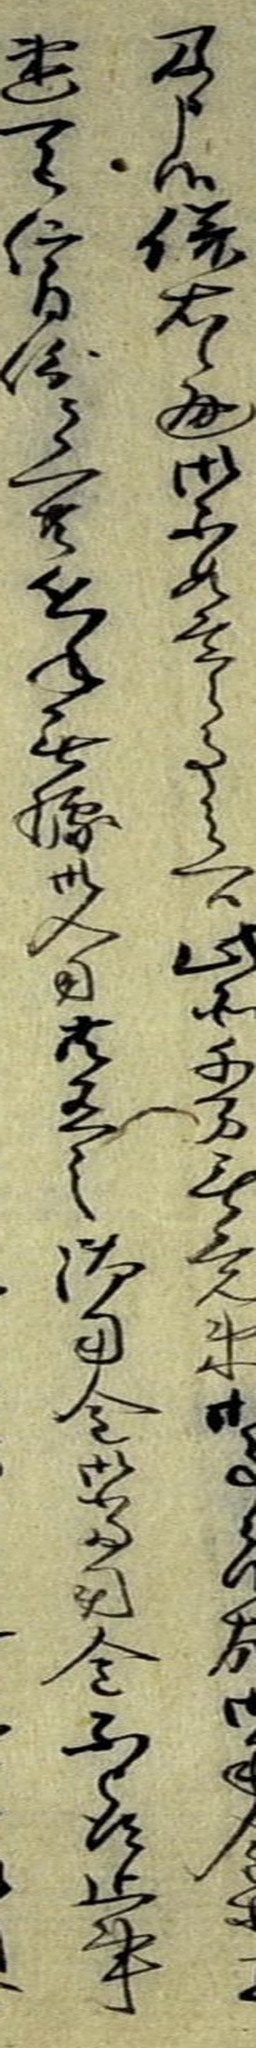速可被仰付儀ニ候へ共近年無拠御入用共有之御用金御当用金不被得止事
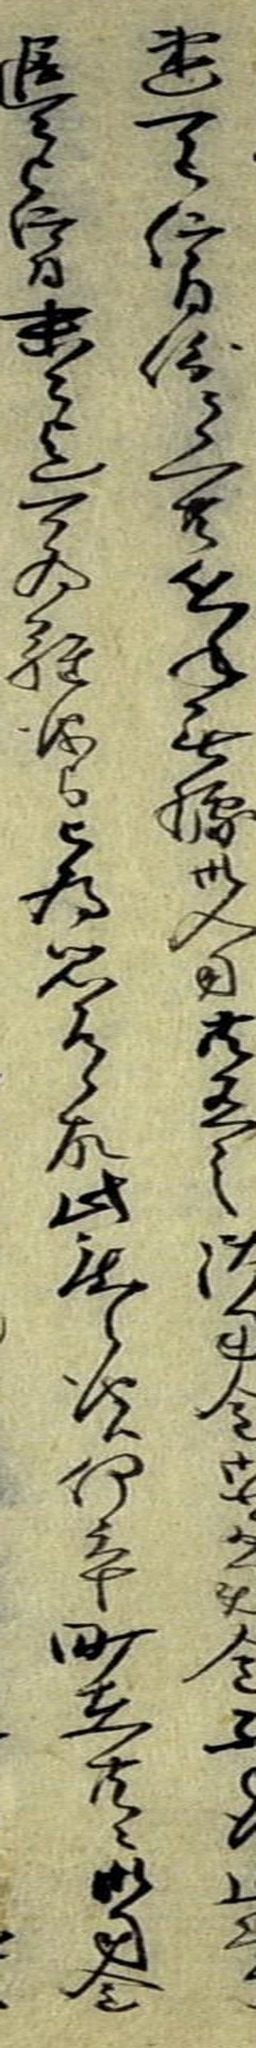追々被仰付末々迄可為難儀与被為思召候故此度之儀ハ何卒町在共ニ御用金
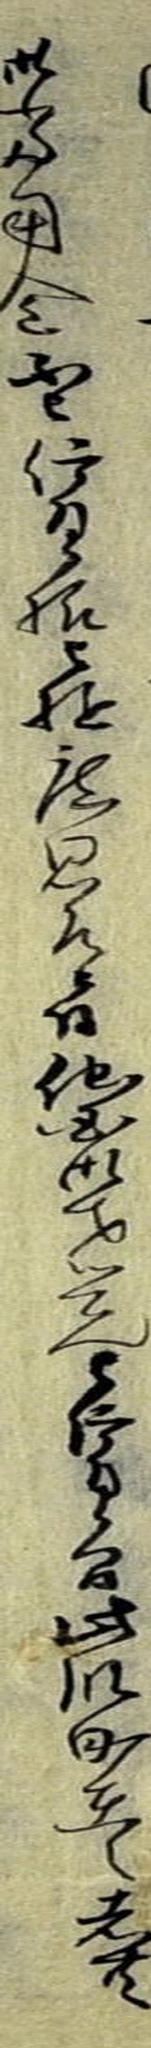御当用金不被仰付候様被遊度思召ニ付他国御才覚被仰付候間此段町在之者共
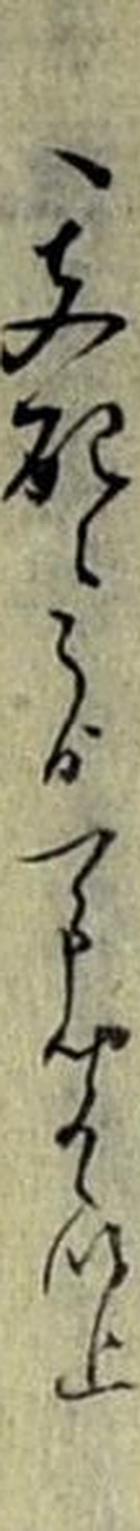へ支配々々ゟ可申聞候以上
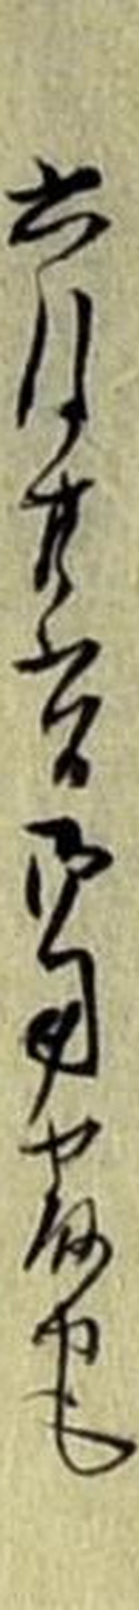六月廿六日御用番宅
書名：命令之部 一
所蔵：福井県文書館 Fukui Prefectural Archives
